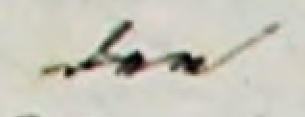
den
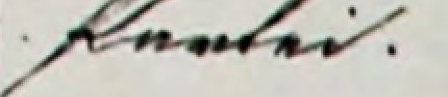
Partei
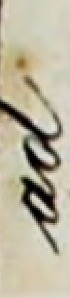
ad
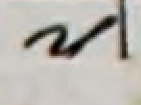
???
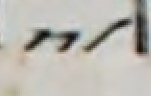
???
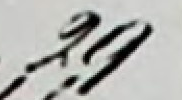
29
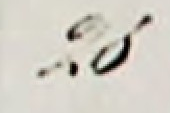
28
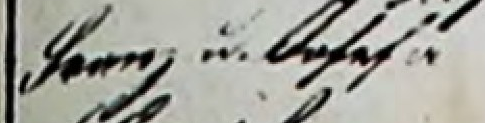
Franz u. Josefa
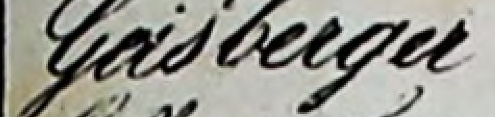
Geisbberger
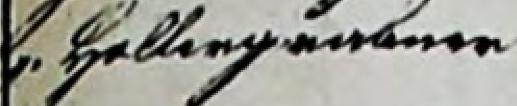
v. Hollengrabner
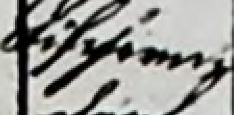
Fischern„
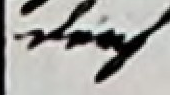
dorf
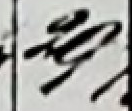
29
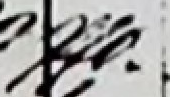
Pfl„
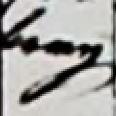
berg
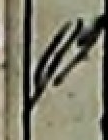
92
